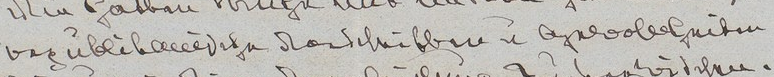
republikanische Vorschriften u Gewohnheiten
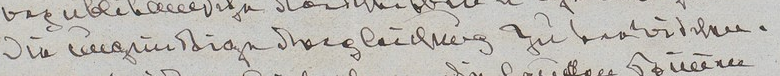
die ungünstige Vergleichung zu verwischen.
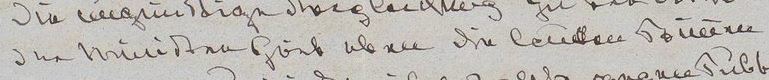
Der Minister hört eben die lauten Stimmen
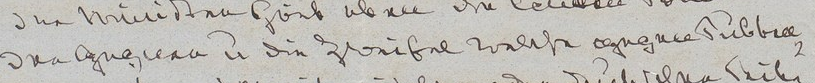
der Gegner u die Zweifel welche gegen Subven-
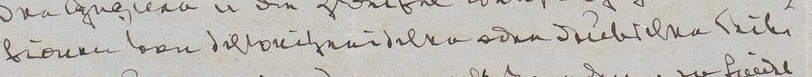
tionen von östreicherischer oder deutschen Seite
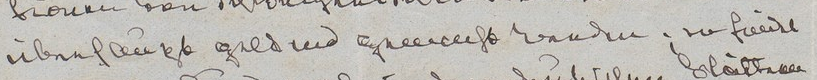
überhaupt geltend gemacht werden; er findet
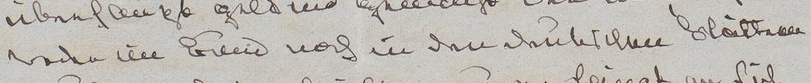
weder im Bund noch in den deutschen Blättern
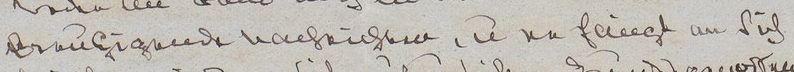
beruhigende Nachrichten, u er fängt an sich
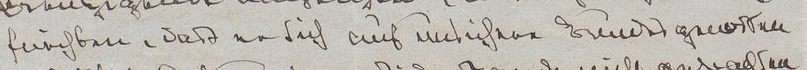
fürchten, dass er sich auf unsichere Bundsgenossen
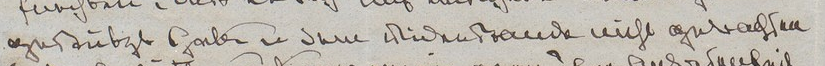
gestützt habe u dem Widerstande nicht gewachsen
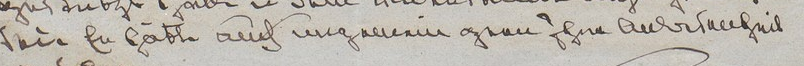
sei. Er hätte auch ungemein gern Ihre Anwesenheit
